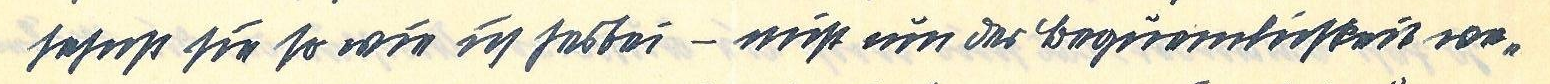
sehnst sie so wie ich herbei – nicht nur der Bequemlichkeit we¬
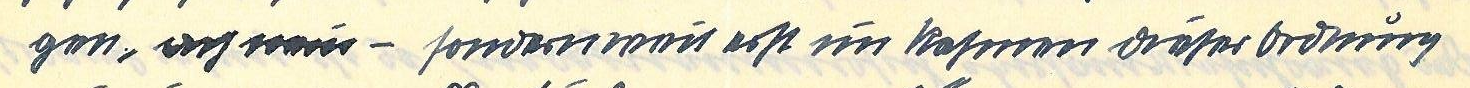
gen, ach nein – sondern weil erst im Rahmen dieser Ordnung
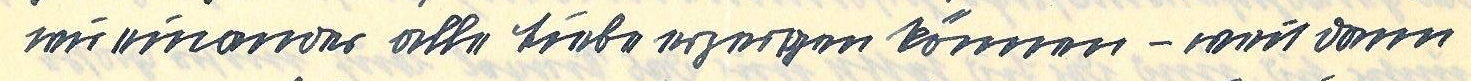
wir einander alle Liebe erzergen können – weil dann
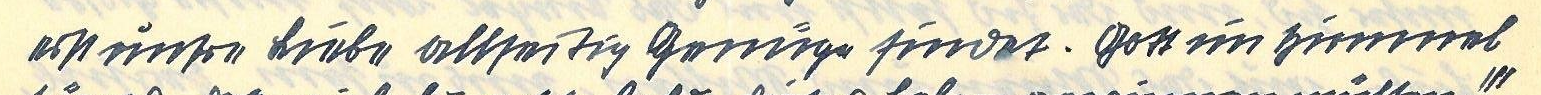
erst unsre Liebe allseitige Genüge findet. Gott im Himmel
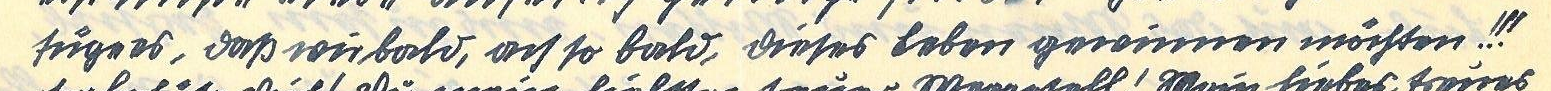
füge es, daß wir bald, ach so bald, dieses Leben gewinnen möchten!!!
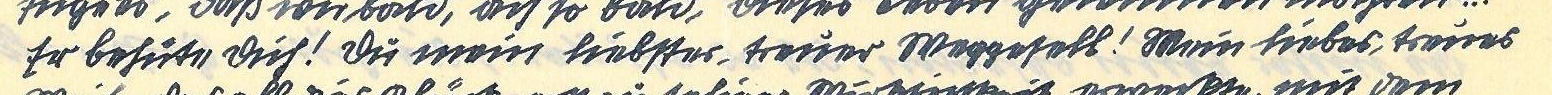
Er behüte Dich! Du mein liebster, treuer Weggesell! Mein liebes, treues
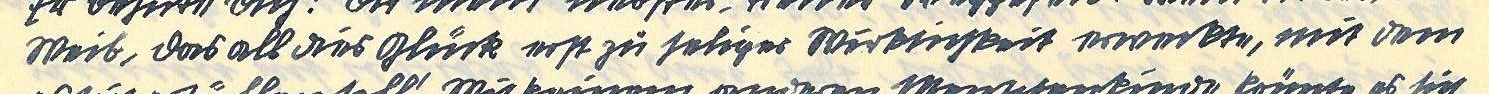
Weib, das all dies Glück erst zu seliger Wirklichkeit erweckte, mit dem
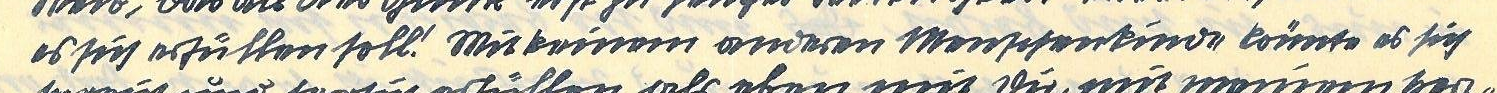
es sich erfüllen soll! Mit keinem anderen Menschenkinde könnte es sich
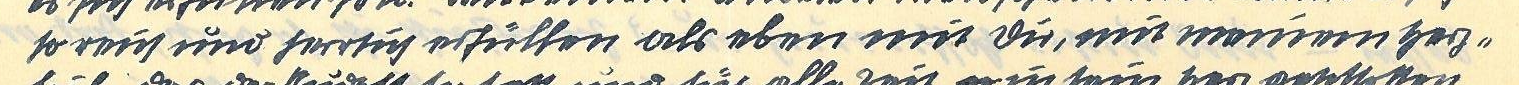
so reich und herrlich erfüllen als eben mit Dir, mit meinem Herz¬
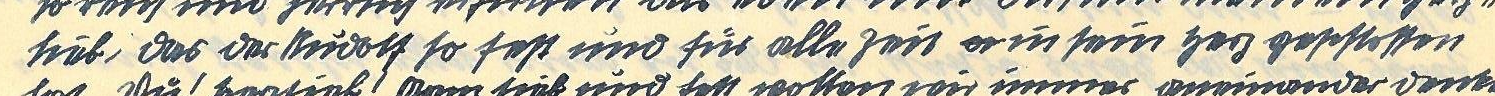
lieb, das der Rudolf so fest und für alle Zeit a in sein Herz geschlossen
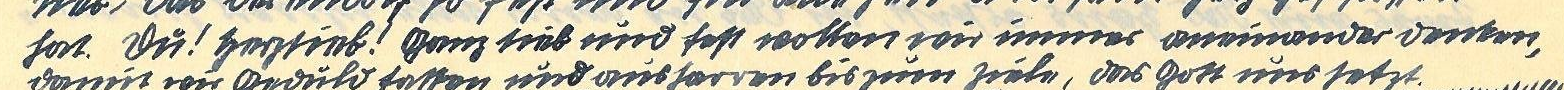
hat. Du! Herzlieb! Ganz lieb und fest wollen wir immer aneinander denken,
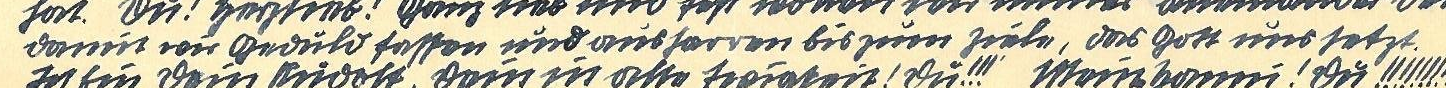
damit wir Geduld fassen und ausharren bis zum Ziele, das Gott uns setzt.
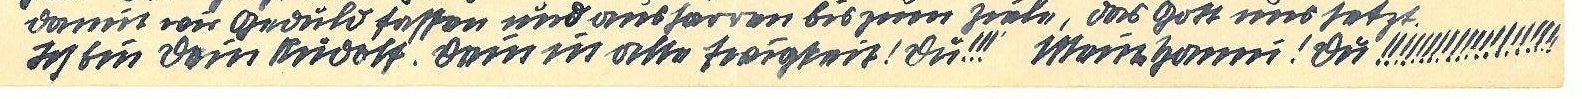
Ich bin Dein Rudolf. Dein in alle Ewigkeit! Du!!! Meine! Du!!!!!!!!!!!!!!!!!!!!
